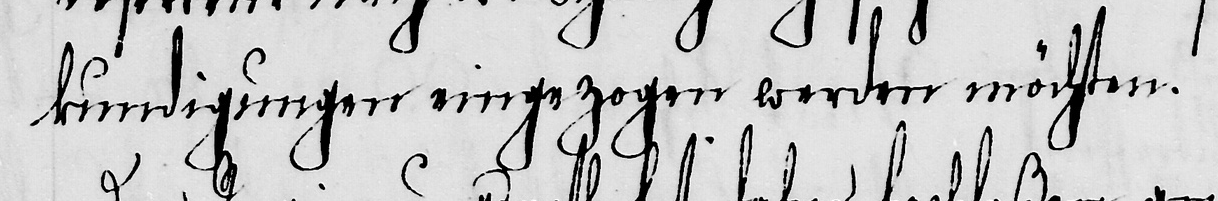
kundigungen eingezogen werden möchten.
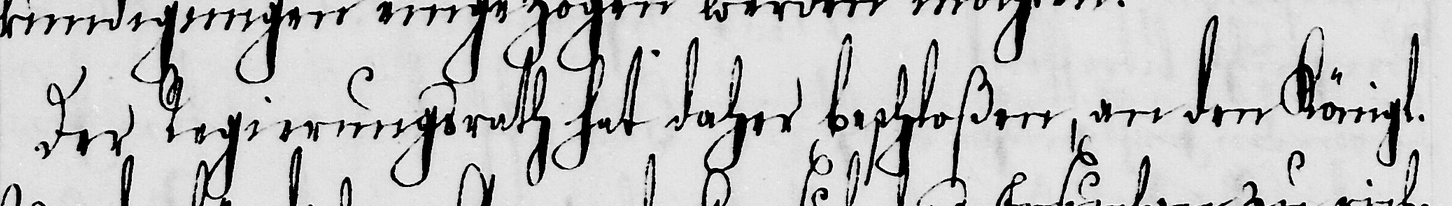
Der Regierungsrath hat daher beschloßen, an den Königl.
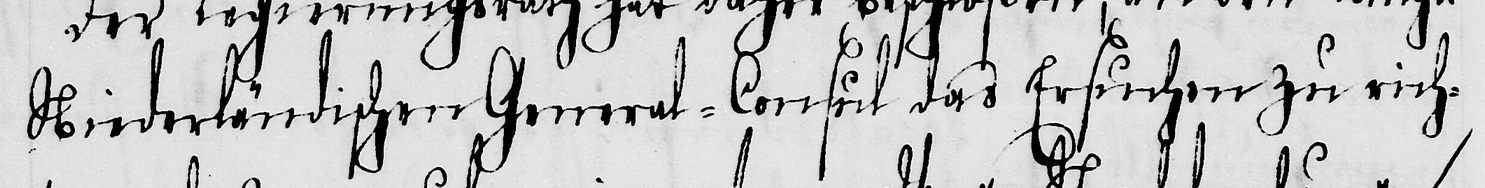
Niederländischen General-Consul das Ersuchen zu rich¬
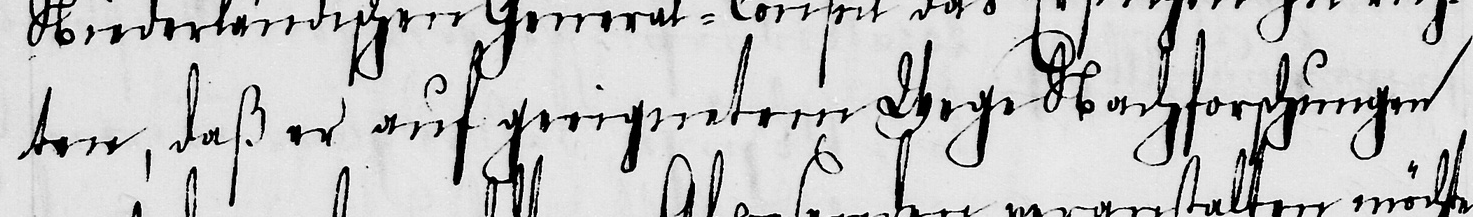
ten, daß er auf geeignetem Wege Nachforschungen
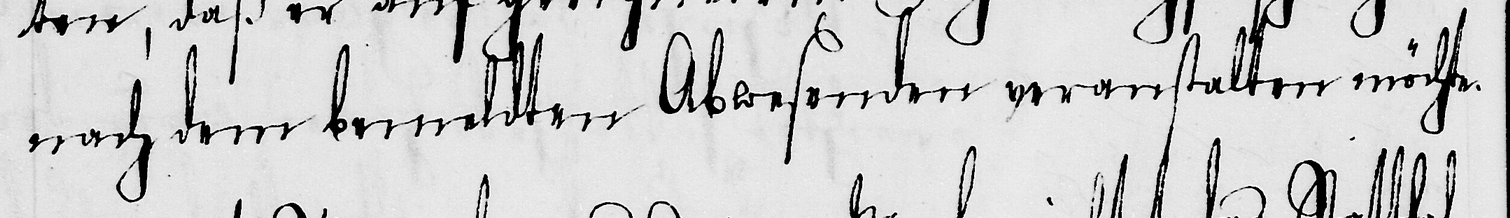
nach dem bemeldten Abwesenden veranstalten möcht¬
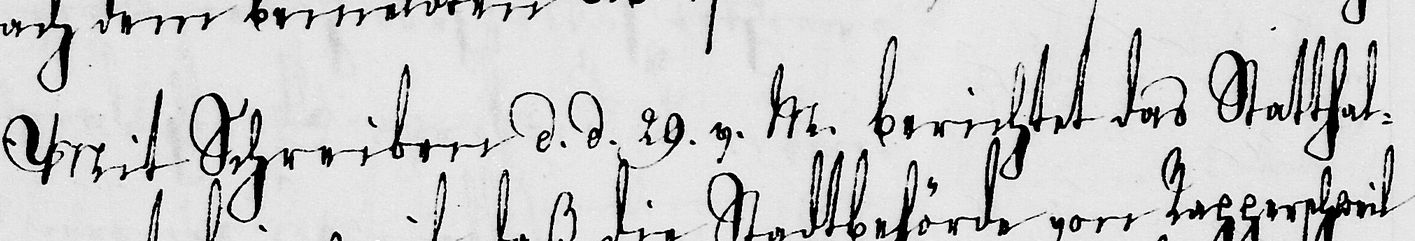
Mit Schreiben d. d. 29. v. M. berichtet das Statthal¬
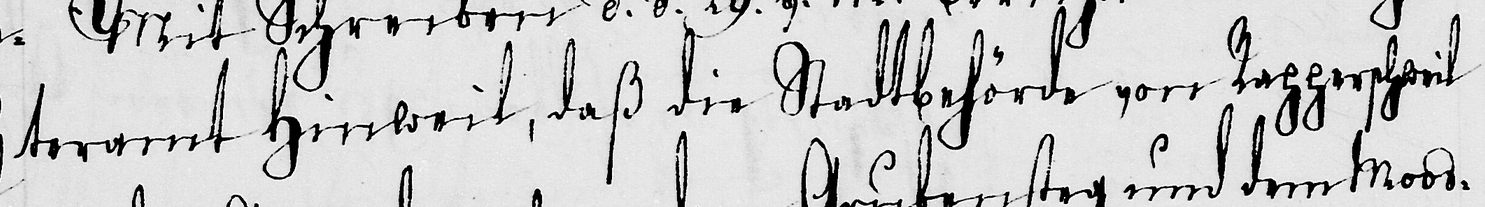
teramt Hinweil, daß die Stadtbehörde von Rapperschweil
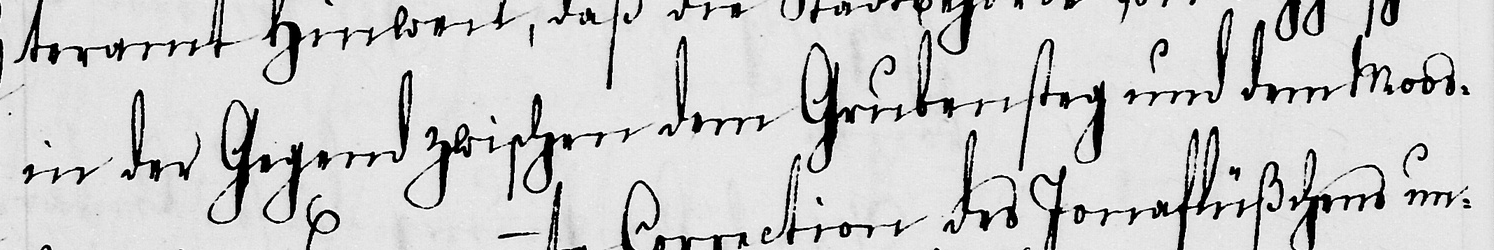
in der Gegend zwischen dem Grubensteg und dem Moos¬
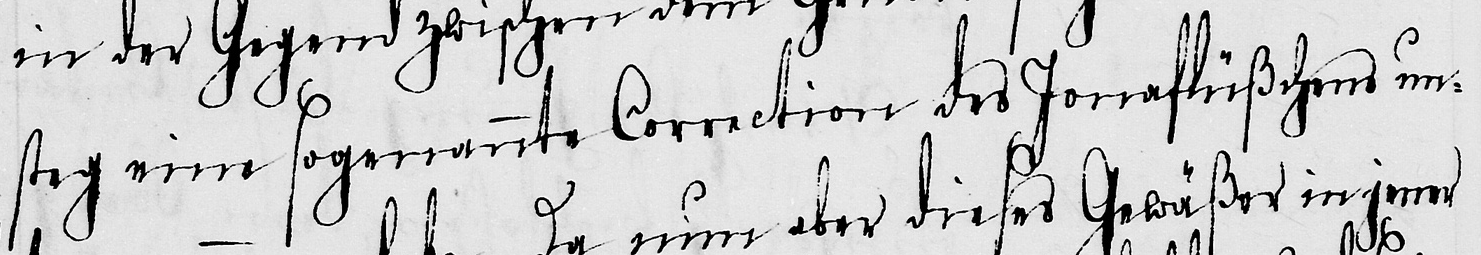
steg eine sogenannte Correction des Jonaflüßchens un¬
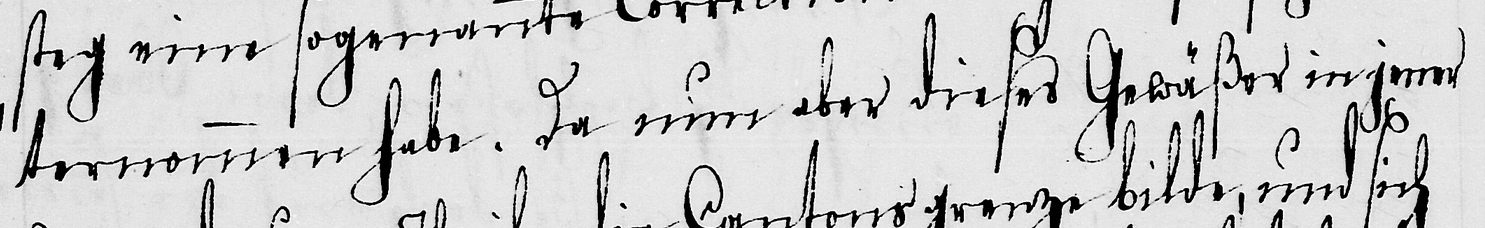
ternommen habe. Da nun aber dieses Gewäßer in jener
